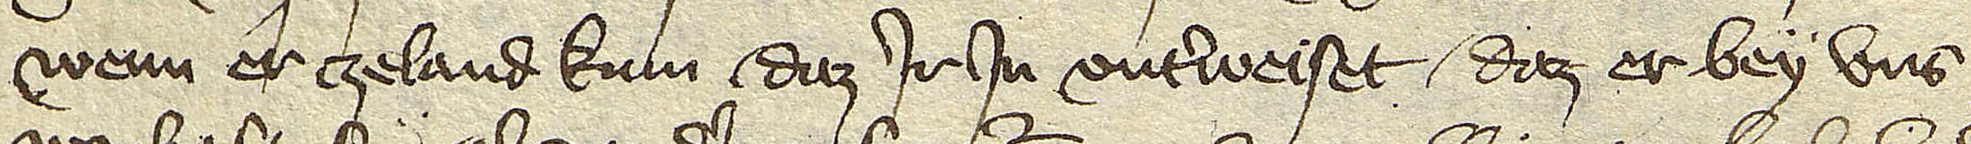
wenn er cʒeland kum / daʒ Ir In vnt*weiſet / daʒ er bey vns
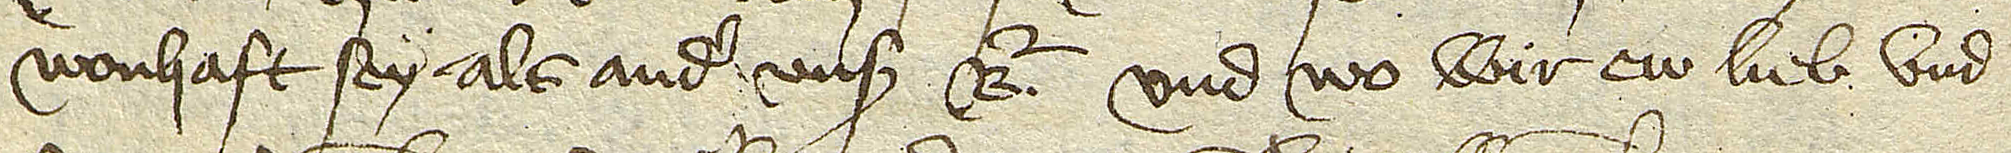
wonhaft ſey / als and* vnſ* B* . vnd wo wir ew lieb vnd
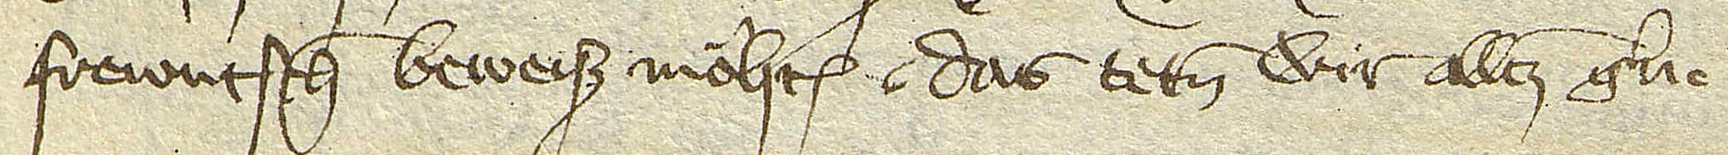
frewntſch* beweiſ* möht* / das tetn* wir allcʒ* g*ne
